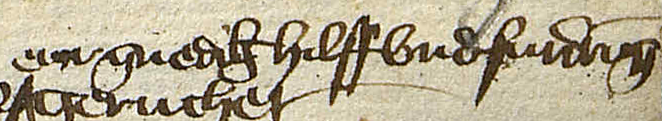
ewr gnedig hilff vnd furdrug*
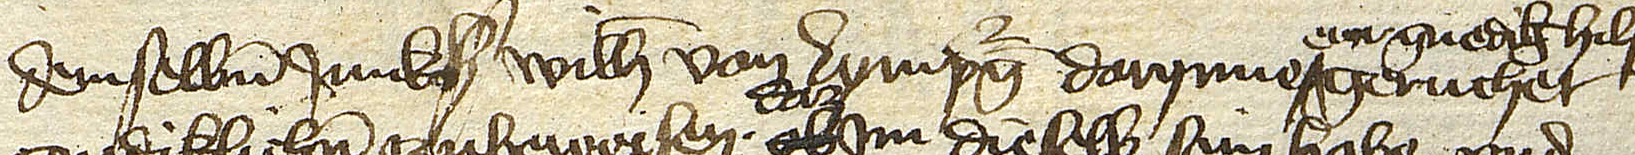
demſelbn* Iunkh* wilh* von Lymp*g darynne geruchet
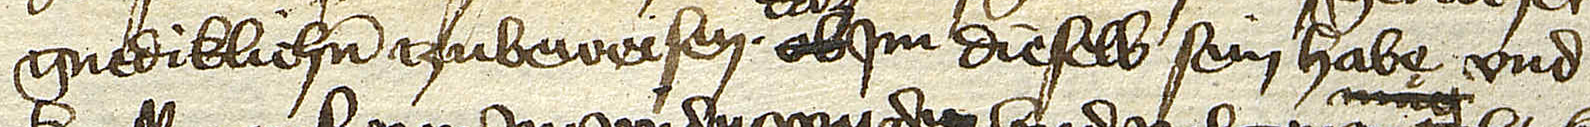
gnediklichn* cʒubeweiſen . ob Im dieſelb ſein habe vnd
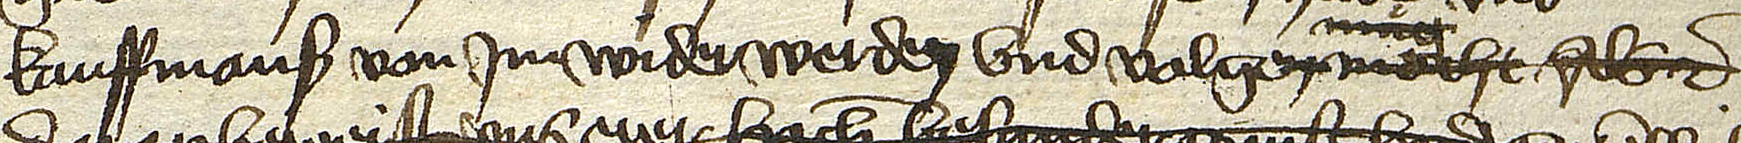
kauffmanſ* vnd Im wider werden vnd volgen macht / Als ec*
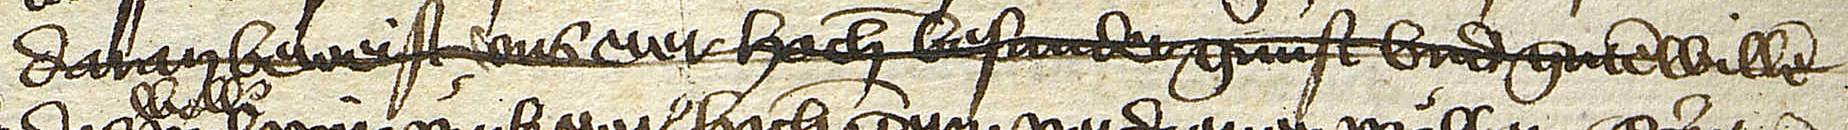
daran beweiſt vns ewr hoch* beſunder gunſt vnd gute* wille*
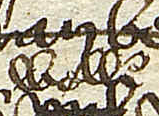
wolle*
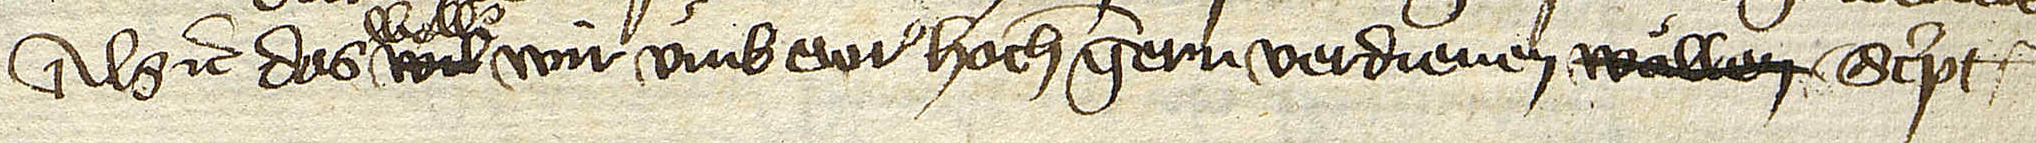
Als ec* das wil wir v̈mb ewr* hoch* gern verdienen wöllen / Sc*pt*
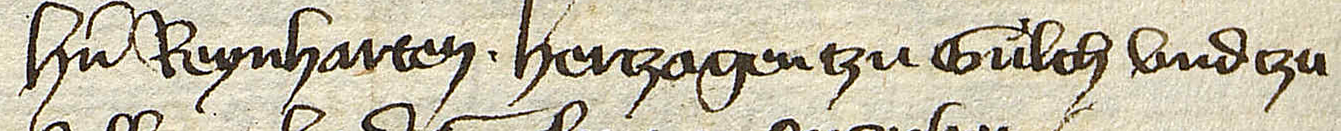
hn* Reynharten . hercʒogen cʒu Gülch vnd cʒu
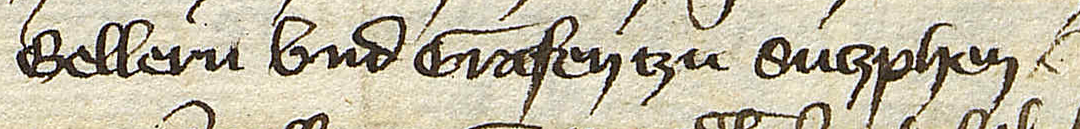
Gellern vnd Grafen cʒu Sucʒphen /
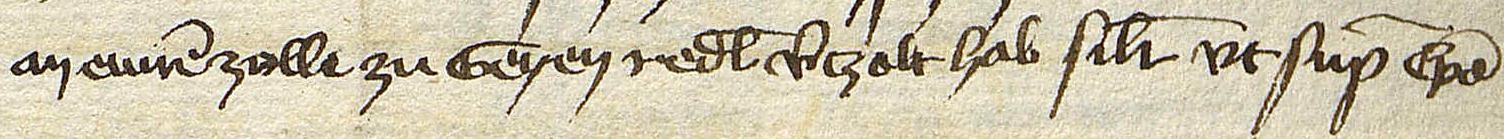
an ewre* ʒolle ʒu Geyen redl* v*cʒolt hab ſilr* vt ſup* Epo*
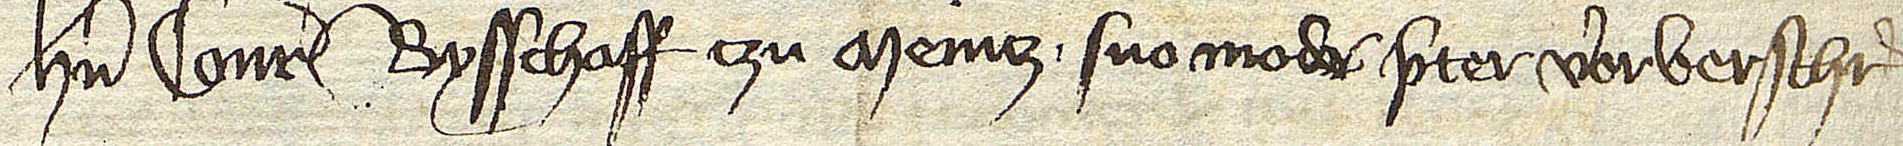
hn* Conr* Byſſchoff cʒu Meincʒ / ſuo modo p*ter vorverſchr*
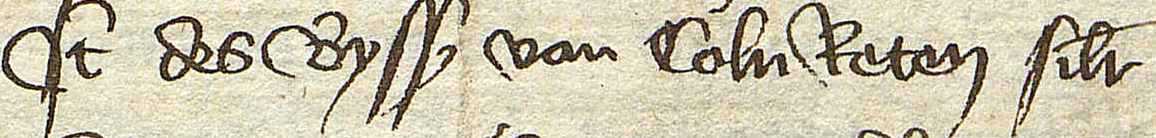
It* des Byſſ* von Cöln Reten ſilr*
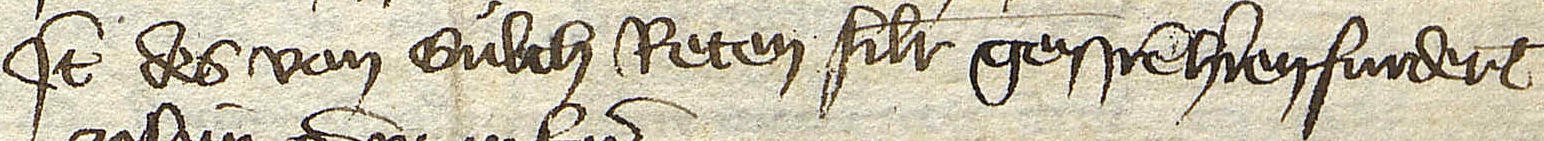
It* des von Gülch Reten ſilr* gen Ire* hr*en furderl*
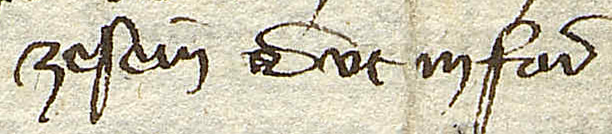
cʒeſein ec* vt in for*
